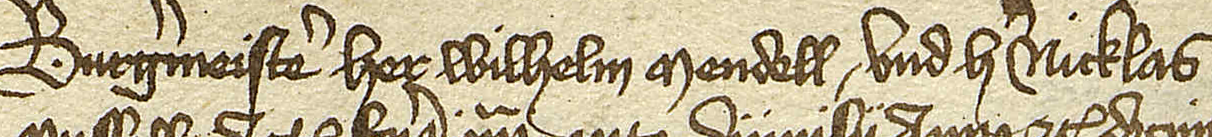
Burg*meiſte* her wilhelm Medell / Vnd h* Nicklas
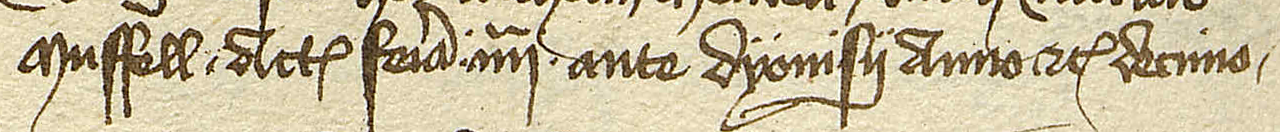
Muffell / Act* feia* . iiii* . ante dyoniſii Anno ec*decimo /
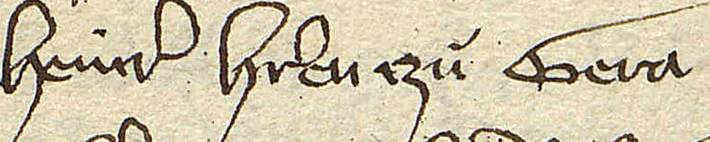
heinr* hr*en cʒü Gera
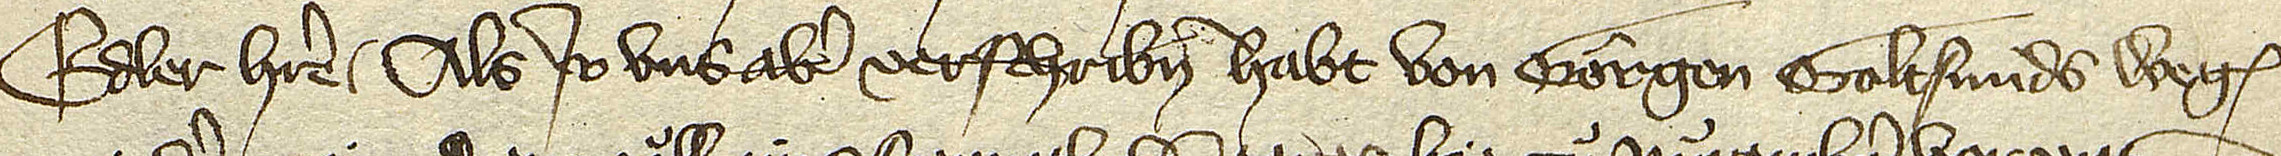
Edler hr*e / Als Ir vns ab* verſchribn* habt von Görgen Goltſmids weg*
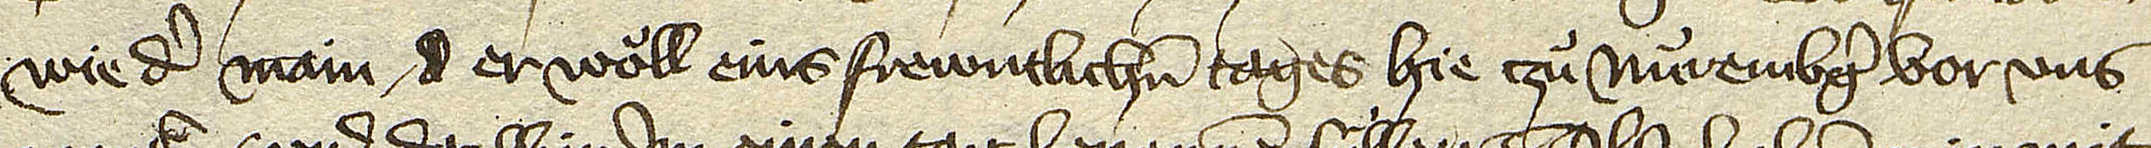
wie d* main / d er wöll eins frewntlichn* tages hie cʒü Nürembg* vor vns
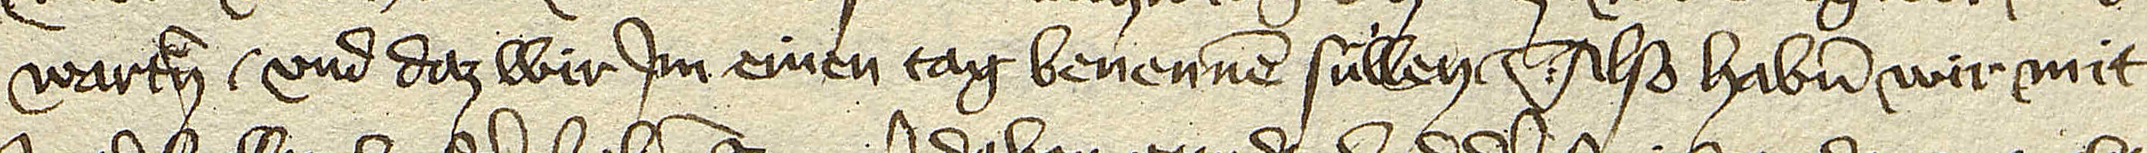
wartn* / vnd daʒ wir Im einen tag benenne* ſüllen / Alſo habn* wir mit
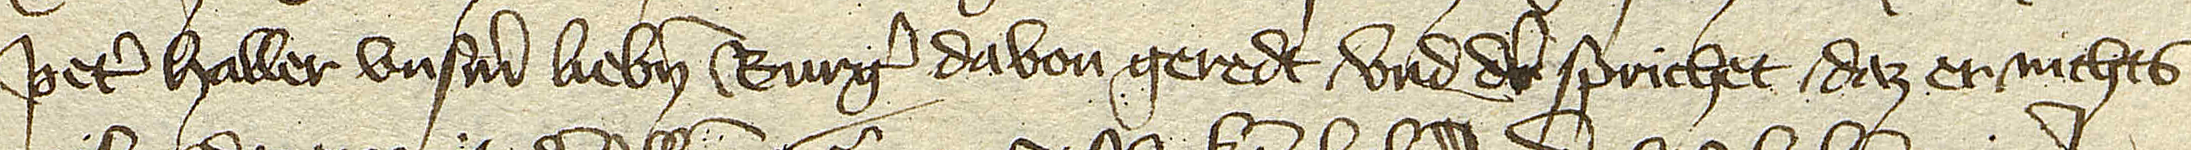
Pet* haller vnſm* liebn* Burg* davon geredt / vnd d* ſprichet / daʒ er nichts
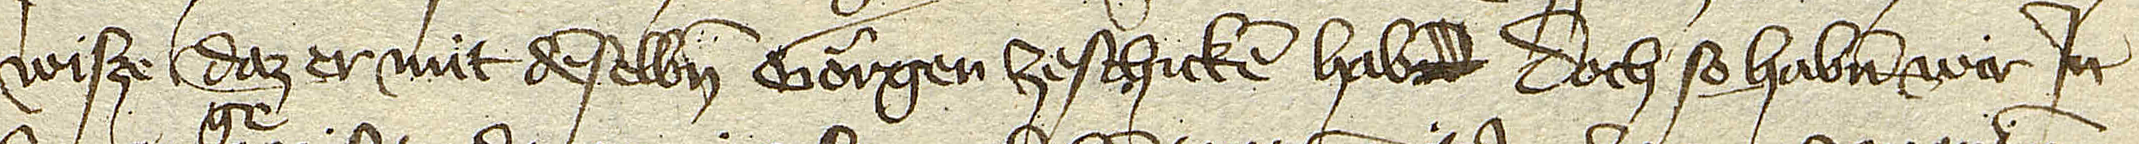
wiſʒe / daſ er mit d*ſelbn* Görgen cʒeſchicke* habn* Doch ſo habn* wir In
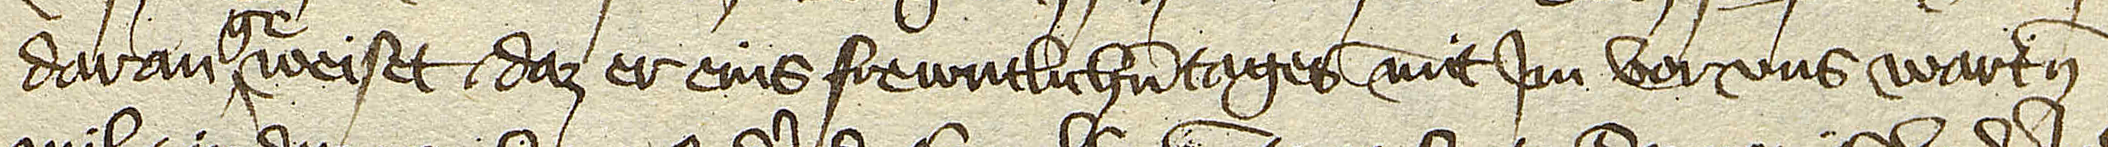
daran weiſet / daʒ er eins frewntlichn* tages mit Im vor vns wartn*
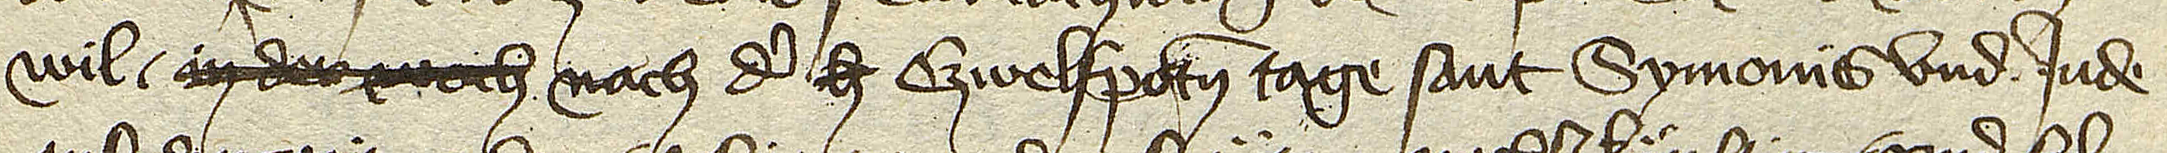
wil / in der woch nach d* h Cʒwelfpotn* tage ſant Symonis vnd Iude
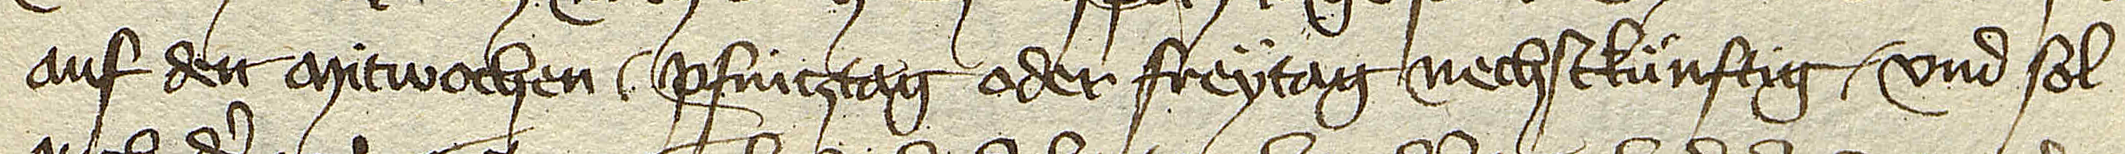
auf den Mitwochen / pfincʒtag oder freytag nechſtkünftig / vnd ſol
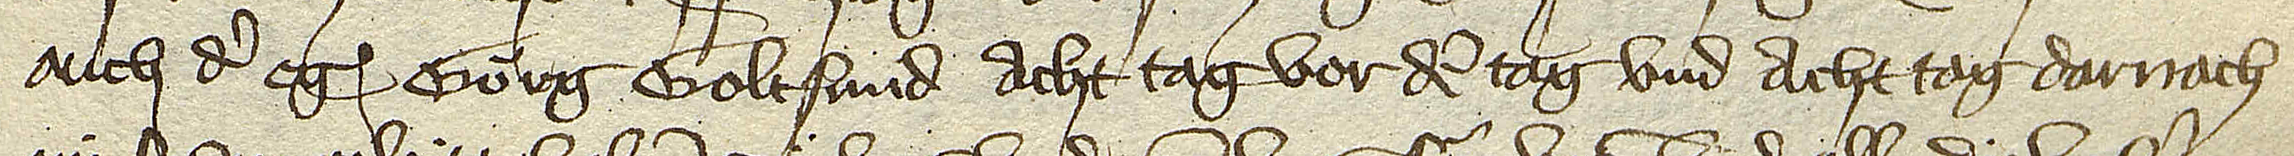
auch d* eg* Görg Goltſmid Acht tag vor d* tag vnd Acht tag darnach
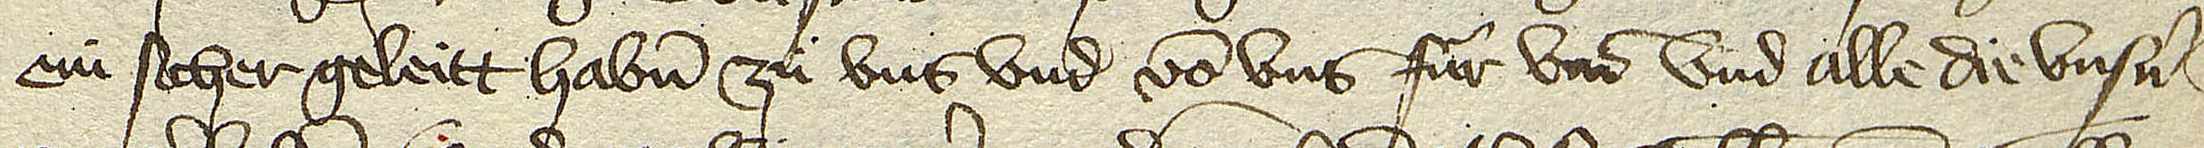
ein ſicher geleitt habn* cʒü vns vnd vo* vns für vns vnd alle die vnſn*
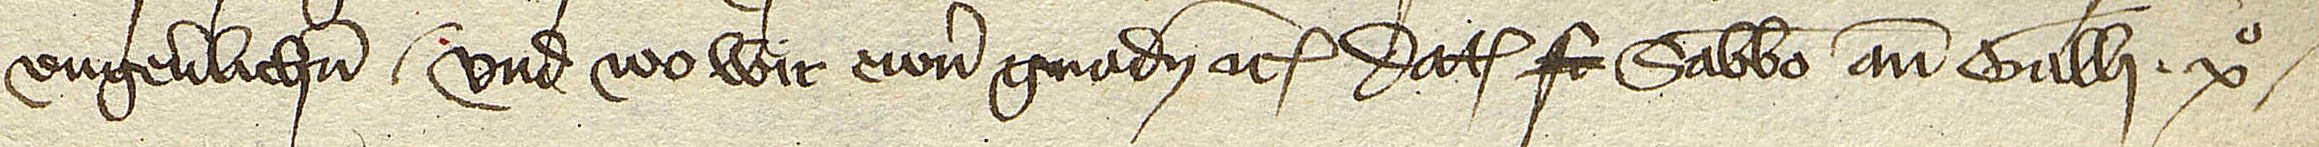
vngeu*lichn* / vnd wo wir ewn* gnadn* ec* dat* ſ% Sabbo* an* Galli* . x* /
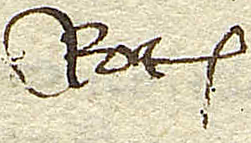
Rot*
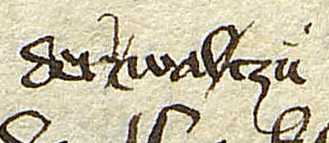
der wal cʒü
